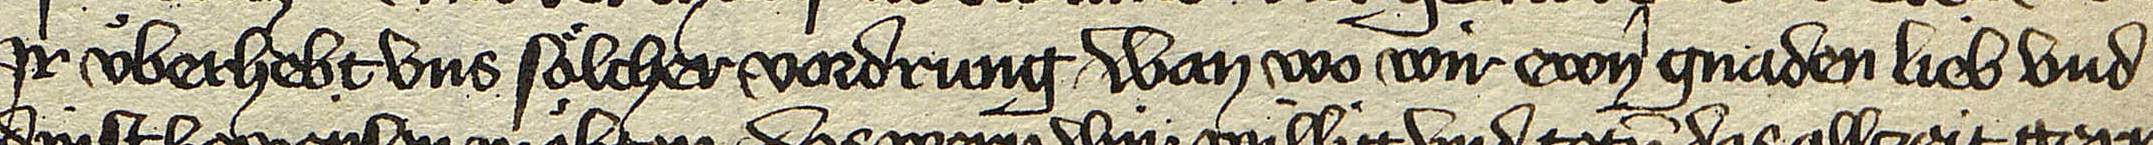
Ir v̈berhebt vns ſölcher vordrung / wan wo wir ewn* gnaden lieb vnd
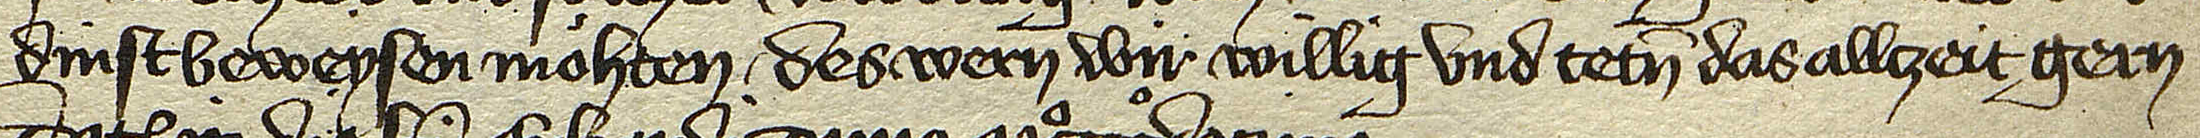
dinſt beweyſen möhten / des wern wir willig vnd tetn* das allcʒeit gern
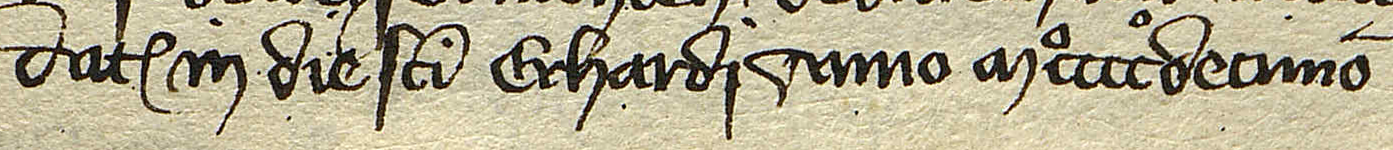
dat* in die ſci* Erhardi Anno M*cccc* decimo
